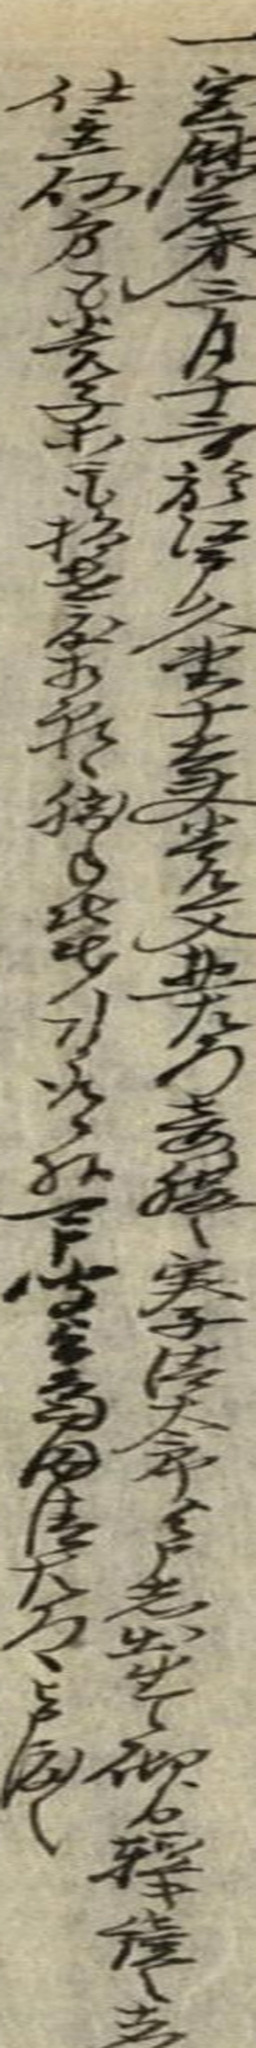仕置何方へも養子等ニも指遣度相願候勝手次第引取候様可申聞旨島田清左衛門へ被申渡候

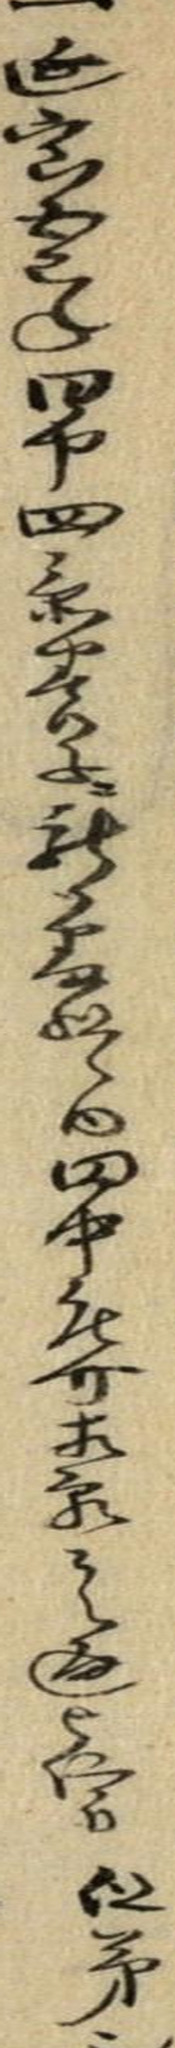一延宝五巳年田中四郎兵衛養子ニ新御番組之内田中庄介相願候之通被仰付但弟也
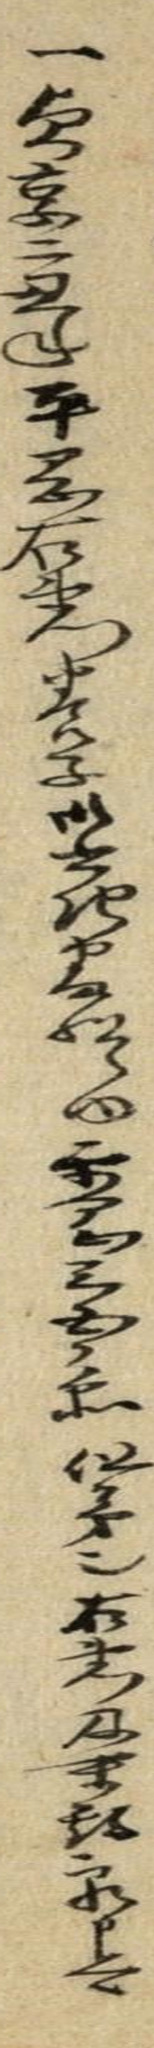一貞享二丑年平岡右衛門養子御書院番組之内平岡三五兵衛但弟也右衛門及末期願申上候
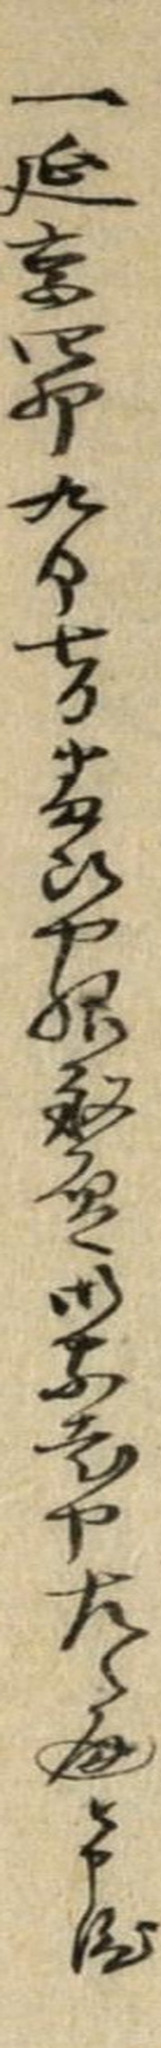一延享四卯九月七日番頭中根靱負へ御家老中左之通被申渡
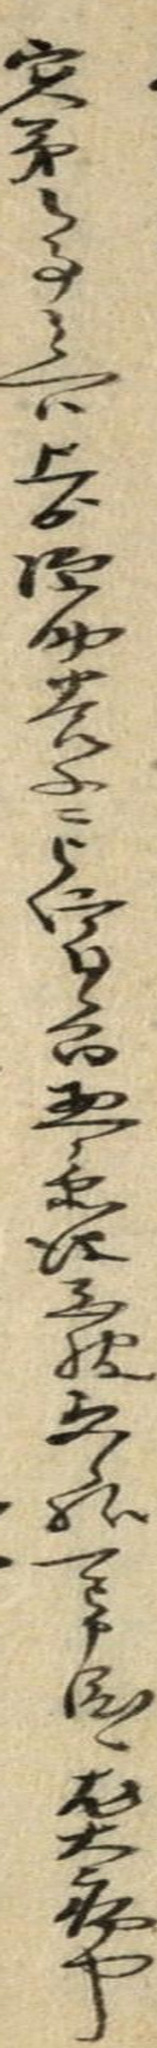実弟之事ニ候へハ上ゟ源助養子ニ被仰付候間惣兵衛儀忌服受候様可被申渡候尤大病中
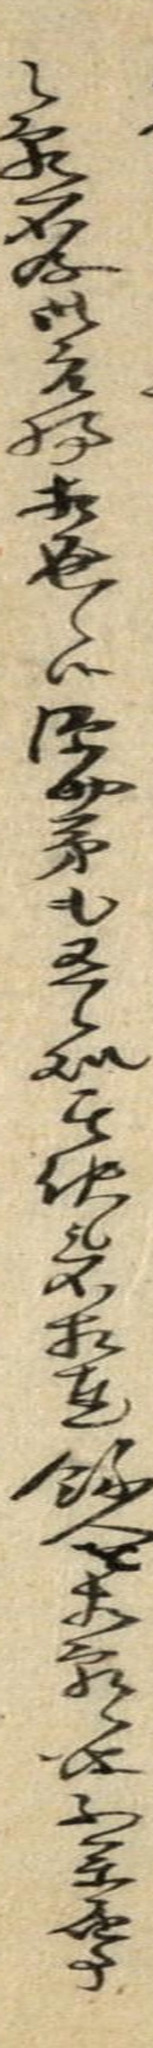之願不及御取揚相返之候源助弟も有之処其訳も不相達余人を相願候儀不参届事
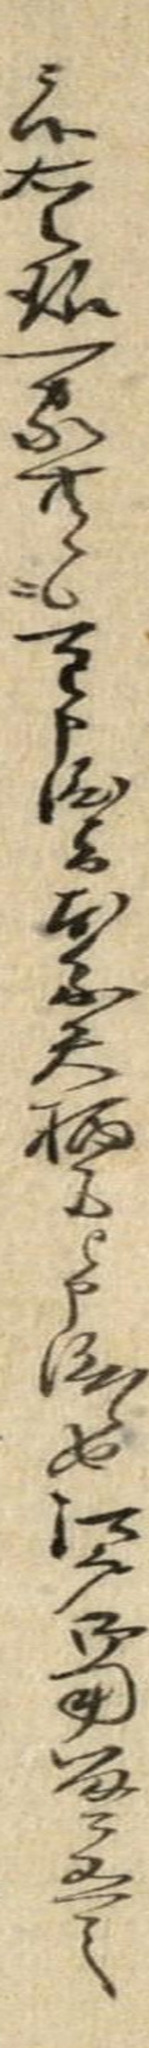ニ候右之趣一家共へも可被申渡旨本多矢柄方被申渡候由江戸御用留ニ有之
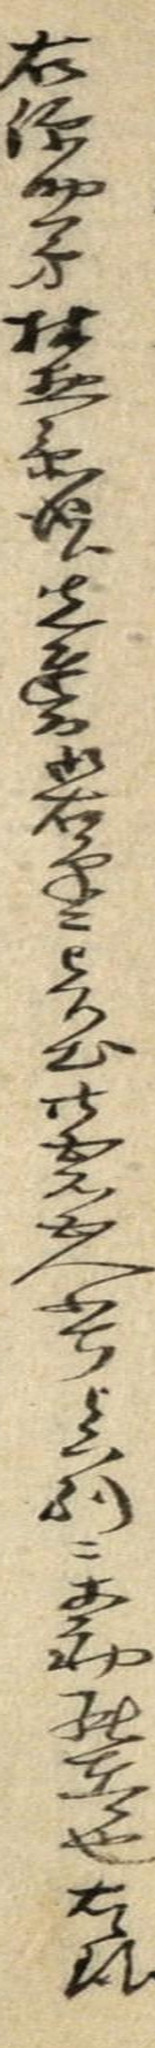右源助弟林惣兵衛儀ハ先達而御右筆ニ被召出廿五石五人ふち被下別ニ相勤罷在候也右之趣
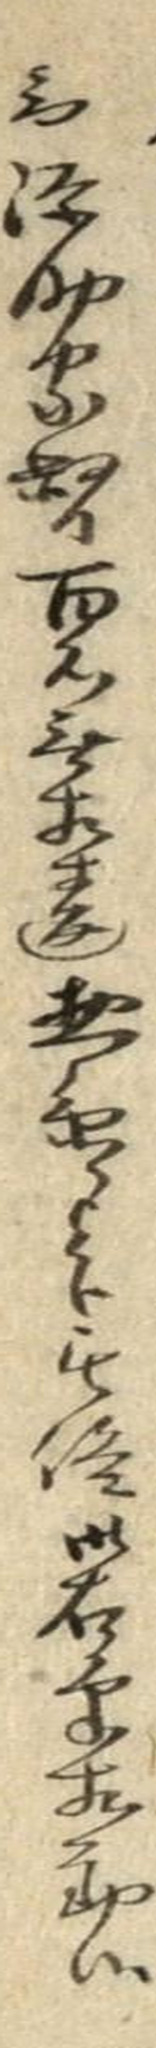二而源助家督百石無相違惣兵衛へ被下其儘御右筆相勤候

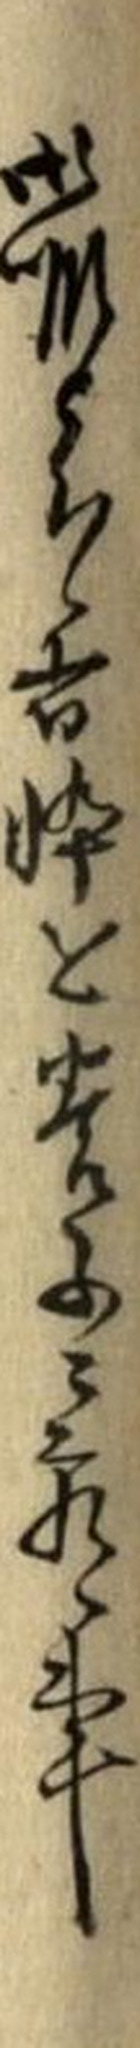御暇被下候者忰を養子ニ願候事
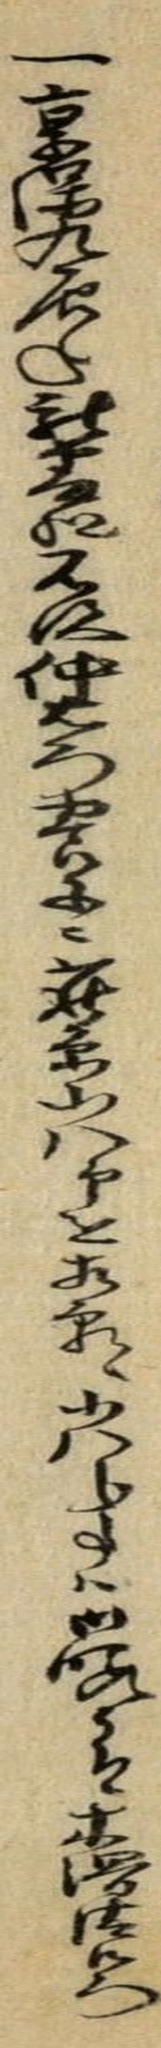一享保九辰年新番組石沢仲右衛門養子ニ萩原小八郎を相願候小八郎事ハ御暇被下候木滑清左衛門
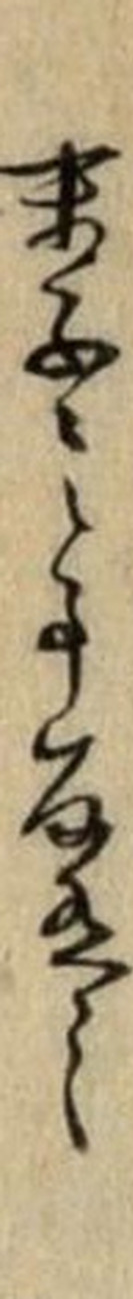末子ニ候事留有之
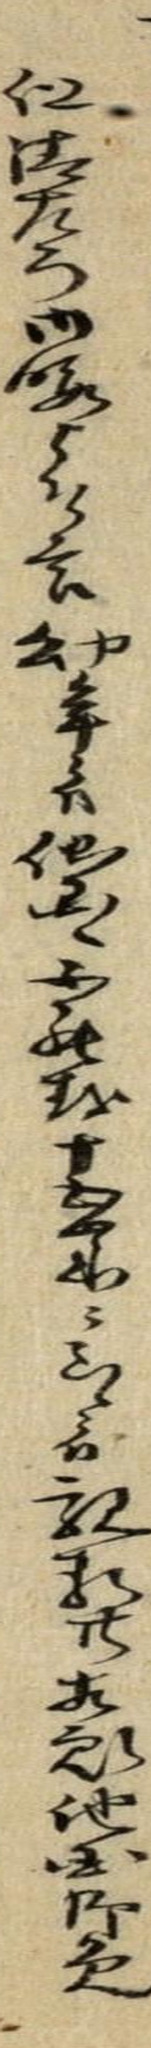但清左衛門御暇被下候節幼年ニ付他国へ不罷越廿五歳ニ至候ニ付親類共相願他国御免
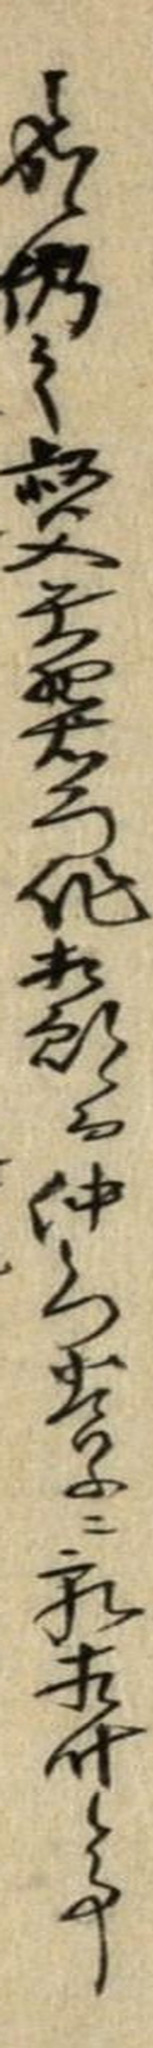被成候仍之叔父矢野右衛門作相願候而仲右衛門養子ニ願相叶候候事
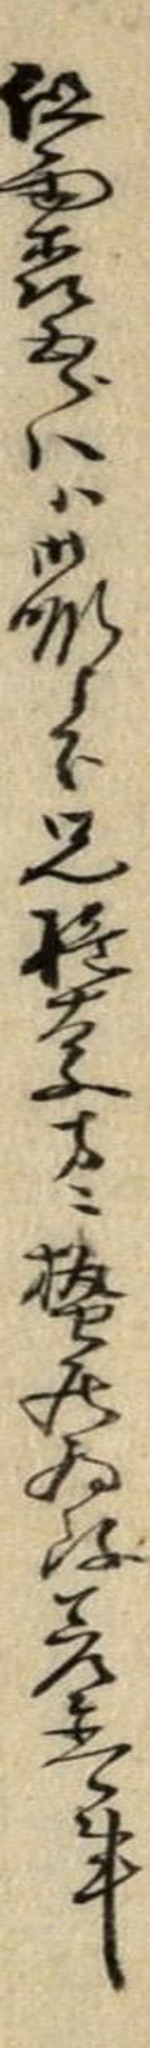但雨森五郎八ハ御暇被下兄権太夫方ニ蟄居為致差置候事
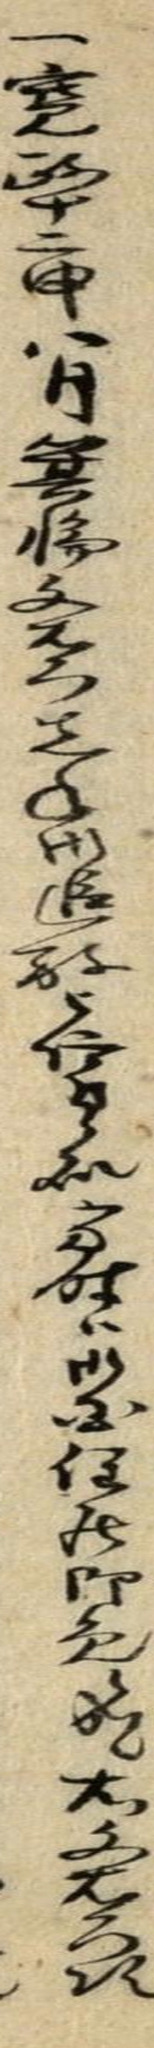一寛政十二申八月箕輪文右衛門先年御追放被仰付候処当時ハ御国住居御免被成候右文右衛門次
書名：養子縁組之部
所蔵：福井県文書館 Fukui Prefectural Archives
